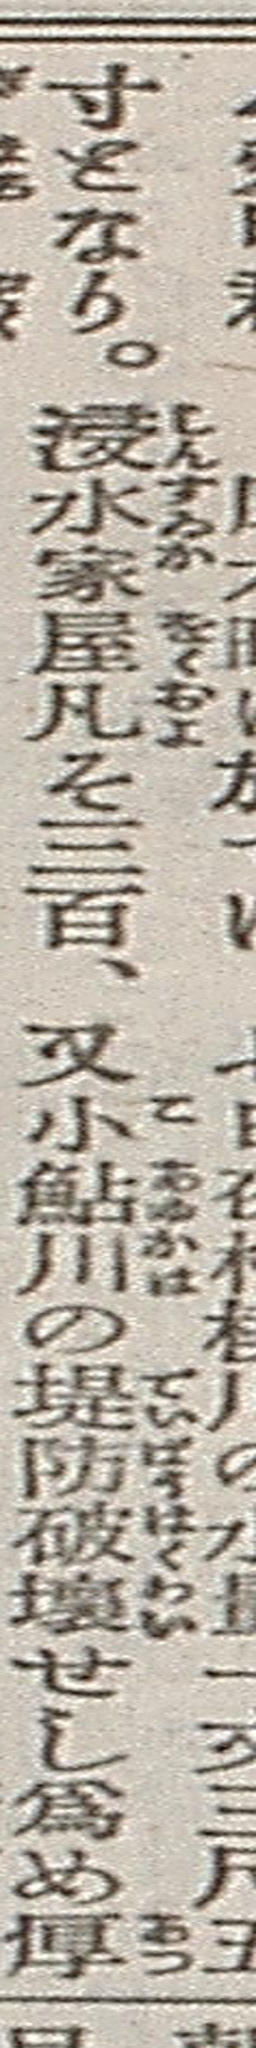寸となり。浸水家屋凡そ三百、又小鮎川の堤防破壊せし為め厚
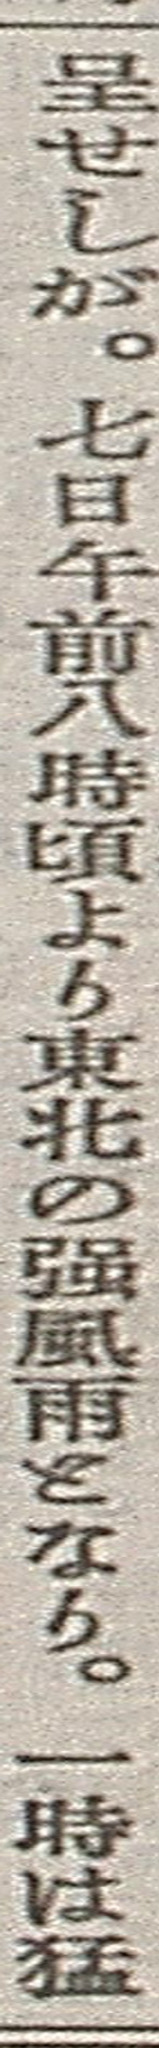呈せしが。七日午前八時頃より東北の強風雨となり。一時は猛
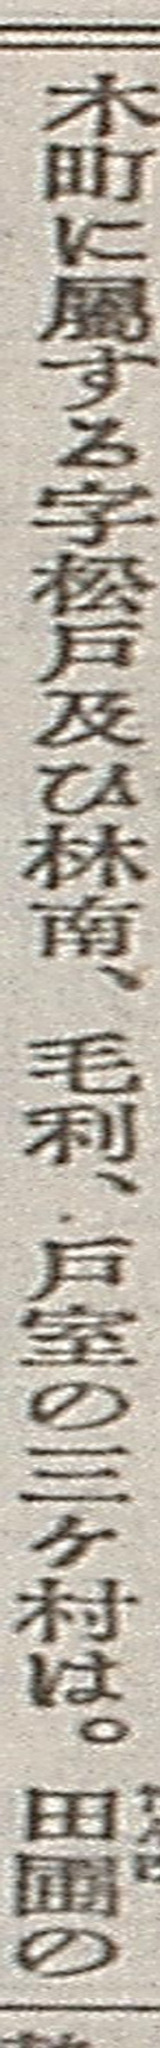木町に属する字松戸及ひ林南、毛利、戸室の三ケ村は。田圃の
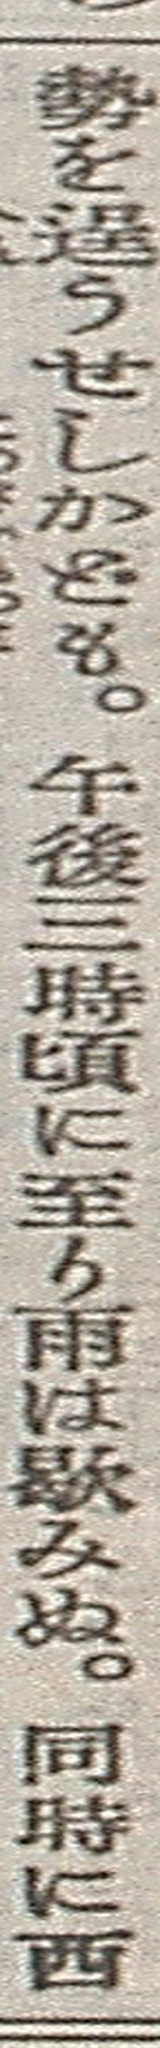勢を逞うせしかども。午後三時頃に至り雨は歇みぬ。同時に西
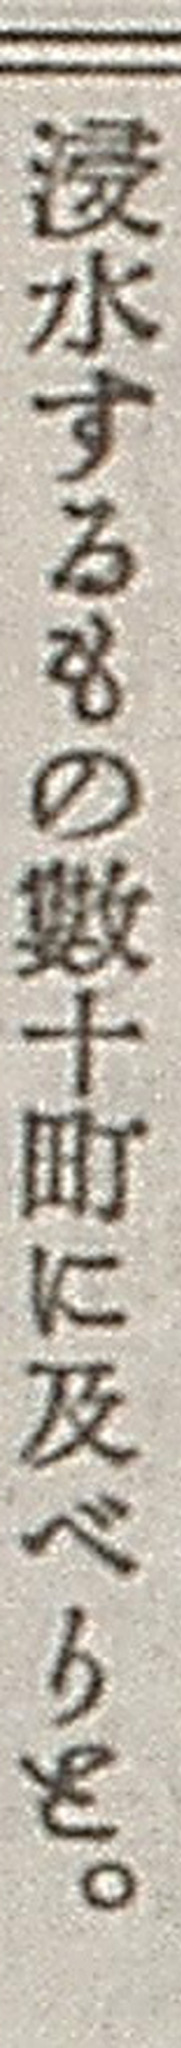浸水するもの数十町に及べりと。
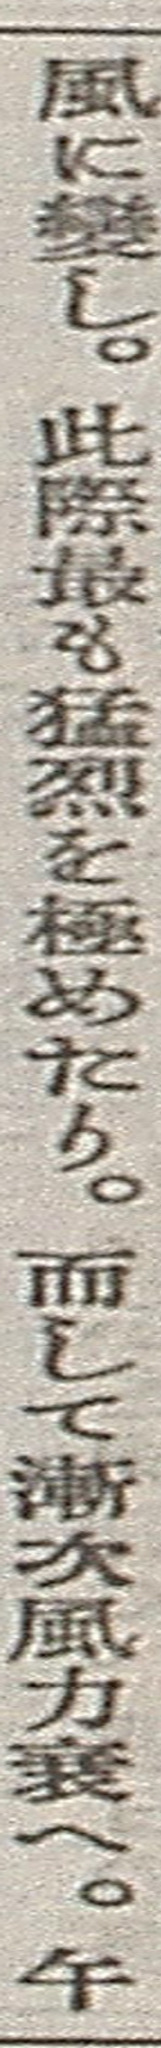風に変し。此際最も猛烈を極めたり。而して漸次風力衰へ。午
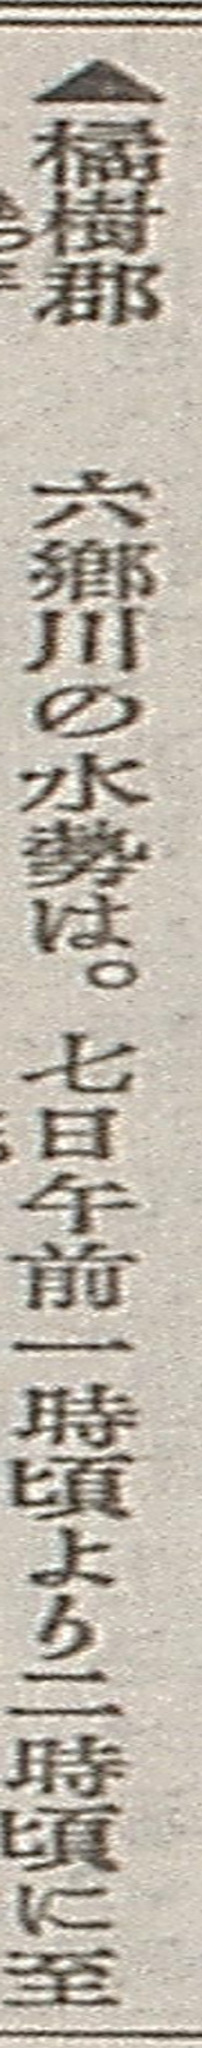▲橘樹郡六郷川の水勢は。七日午前一時頃より二時頃に至
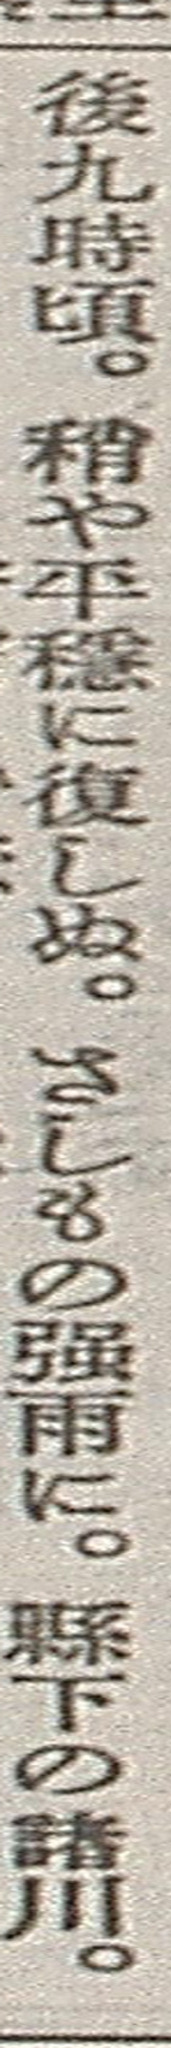後九時頃。稍や平穏に復しぬ。さしもの強雨に。県下の諸川。
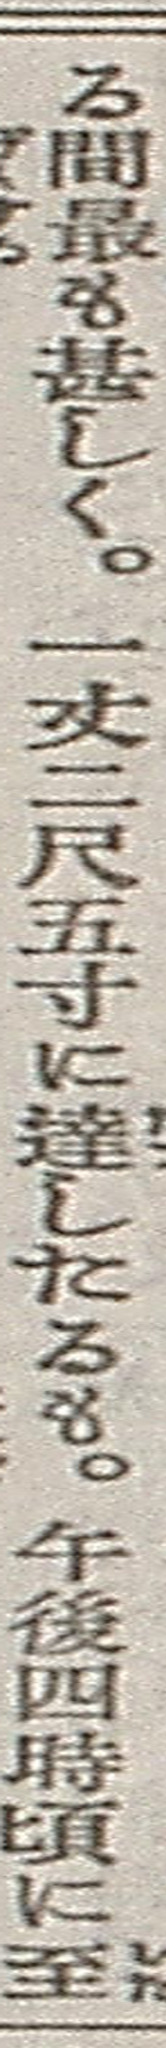る間最も甚しく。一丈二尺五寸に達したるも。午後四時頃に至
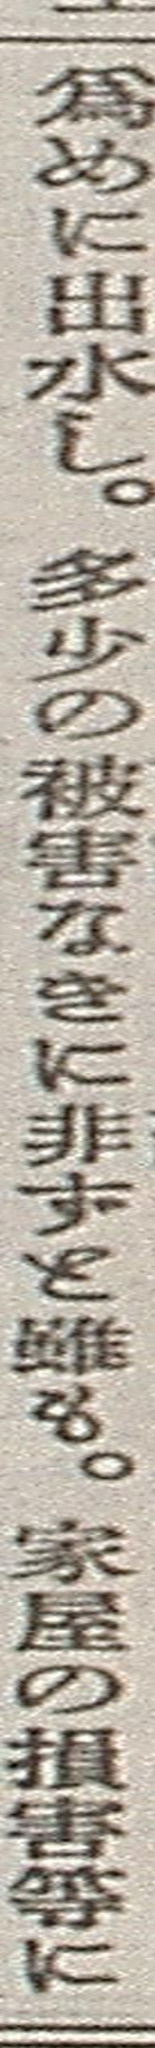為めに出水し。多少の被害なきに非ずと雖も。家屋の損害等に
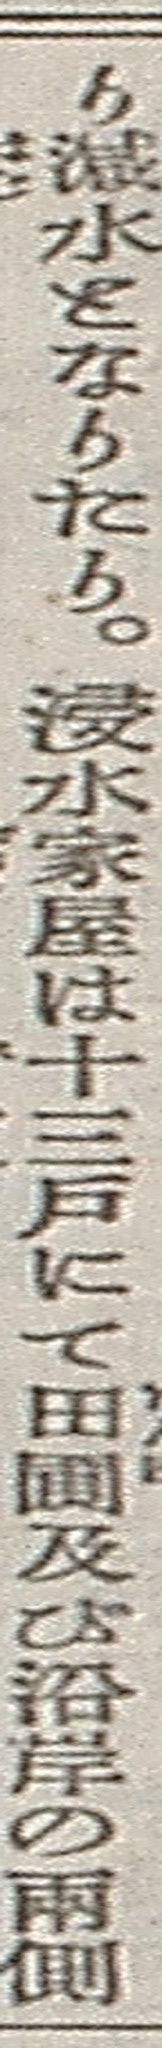り減水となりたり。浸水家屋は十三戸にて田圃及び沿岸の両側
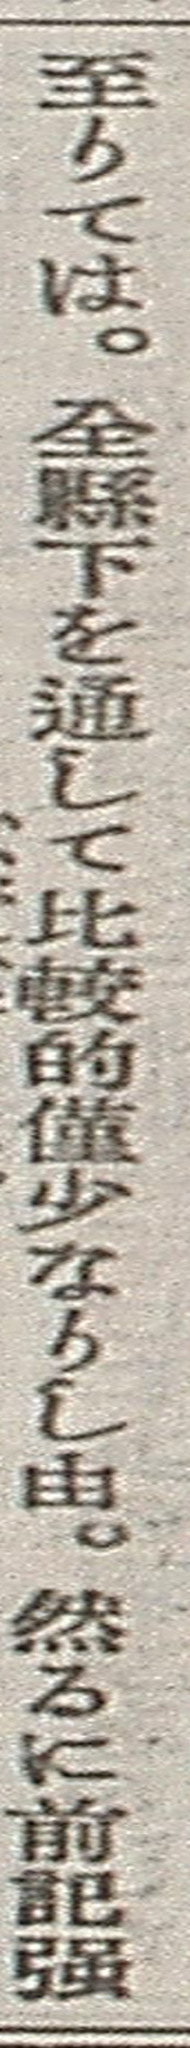至りては。全県下を通して比較的僅少なりし由。然るに前記強
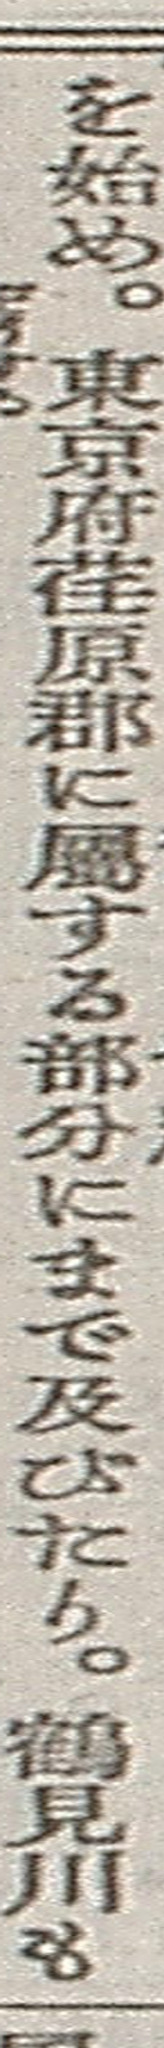を始め。東京府荏原郡に属する部分にまで及びたり。鶴見川も
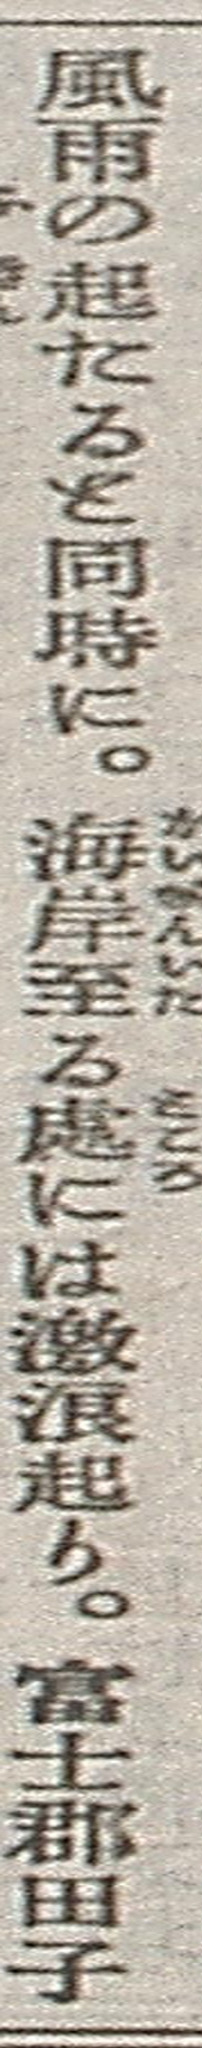風雨の起たると同時に。海岸至る処には激浪起り。富士郡田子
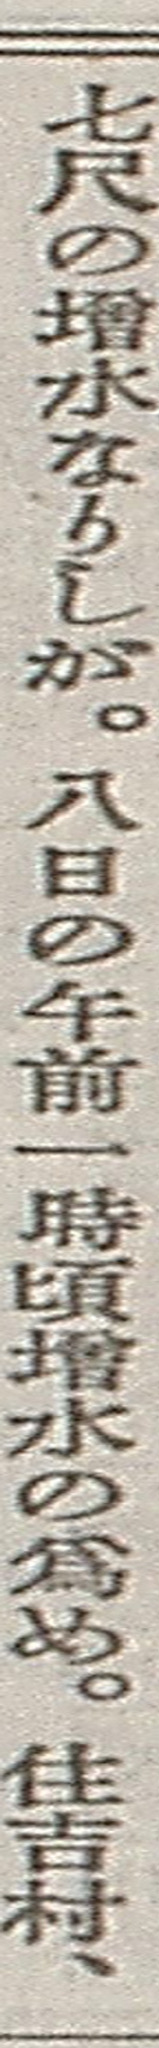七尺の増水なりしが。八日の午前一時頃増水の為め。住吉村、
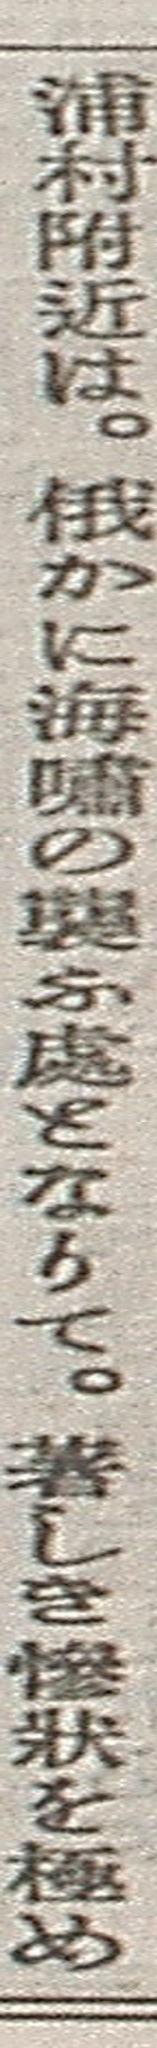浦村附近は。俄に海嘯の襲ふ処となりて。著しき惨状を極め
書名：風俗畫報臨時増刊第百九十九號　明治三十二年十月各地災害圖會（前編之續）
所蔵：東京大学地震研究所図書室 Earthquake Research Institute Library, The University of Tokyo, JAPAN
